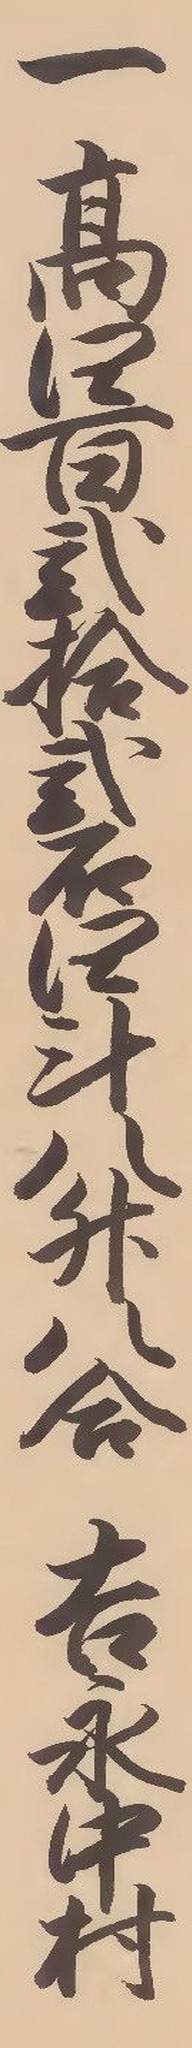一髙四百弐拾弐石四斗八升八合吉永中村
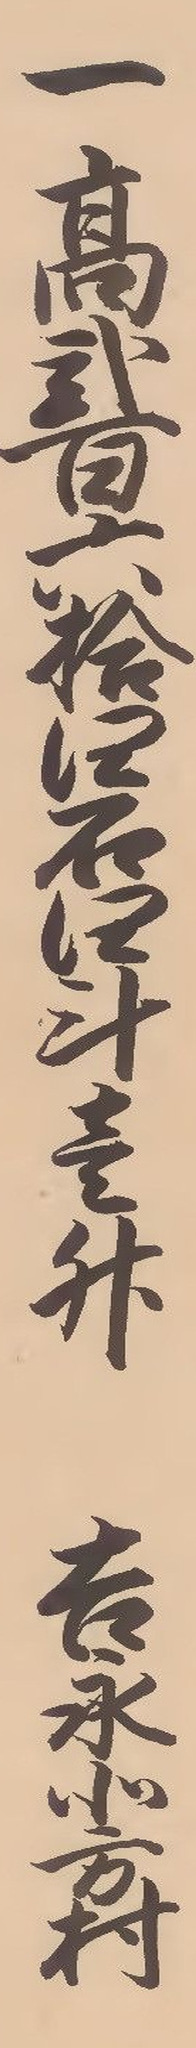一髙弐百六拾四石四斗壱升吉永北方村
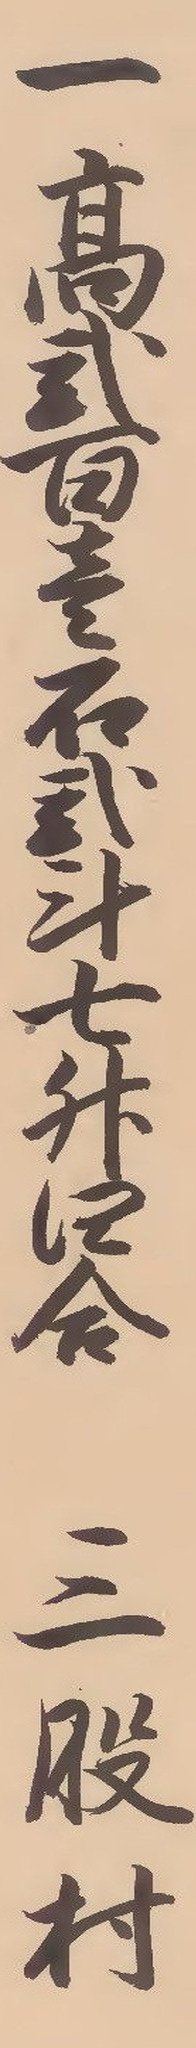一髙弐百壱石弐斗七升四合三股村

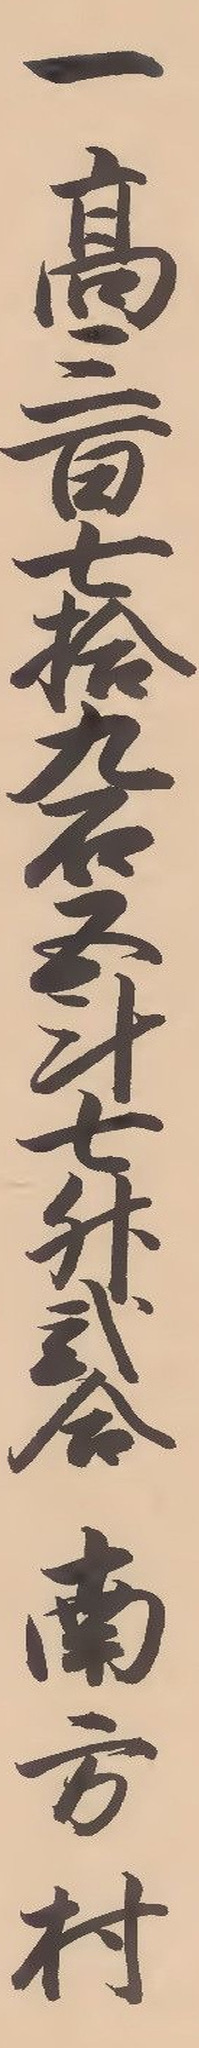一髙三百七拾九石五斗七升弐合南方村
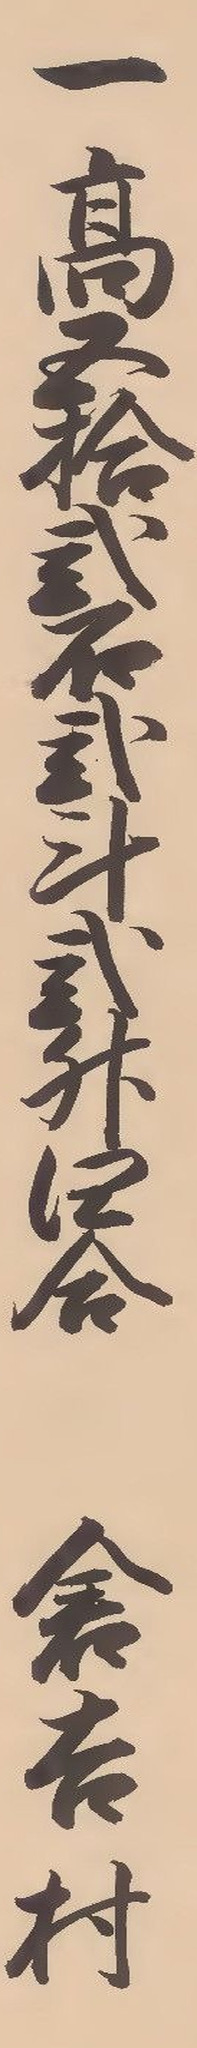一髙五拾弐石弐斗弐升四合倉吉村
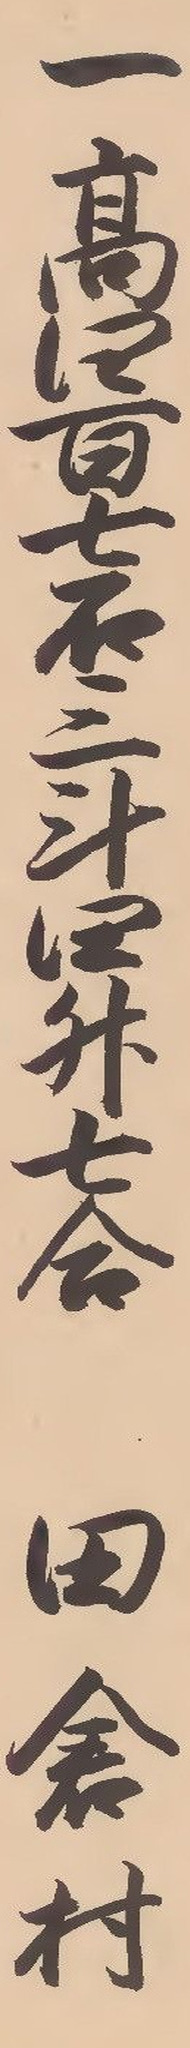一髙四百七石三斗四升七合田倉村
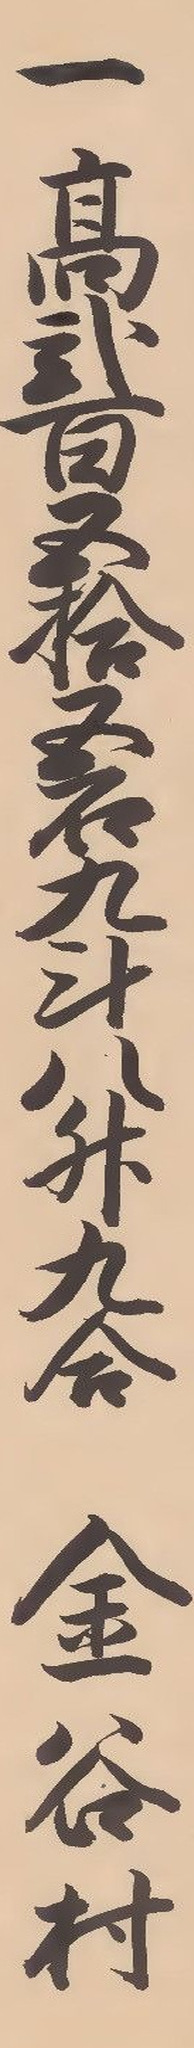一髙弐百五拾五石九斗八升九合金谷村
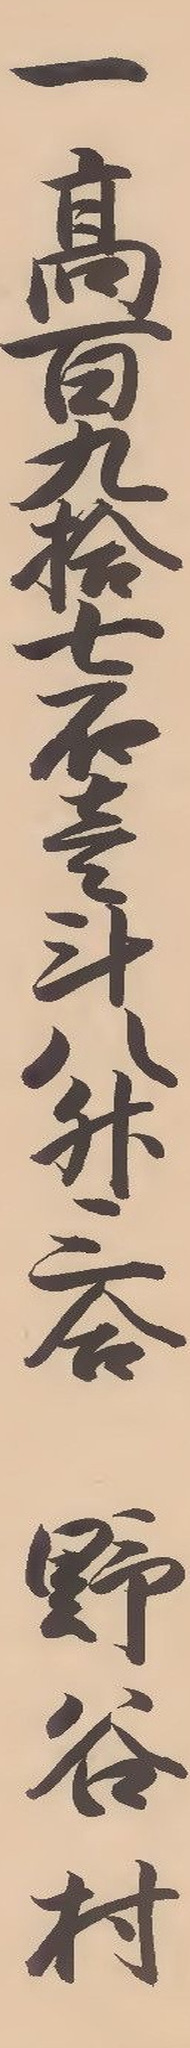一髙百九拾七石壱斗八升三合野谷村
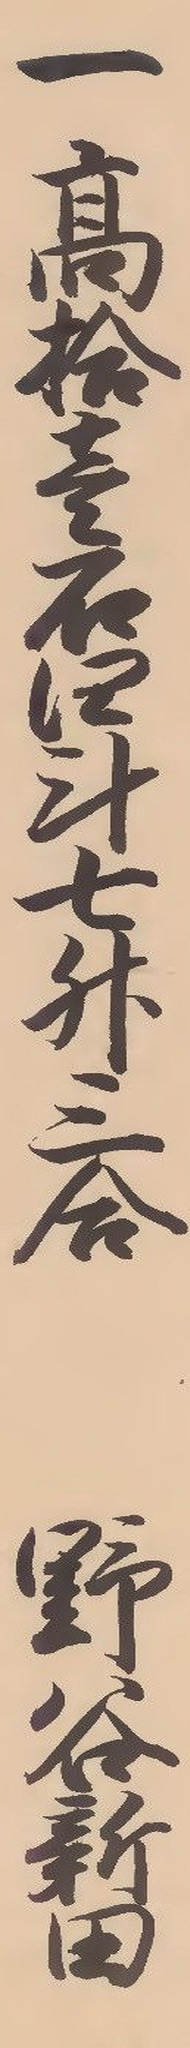一髙拾壱石四斗七升三合野谷新田
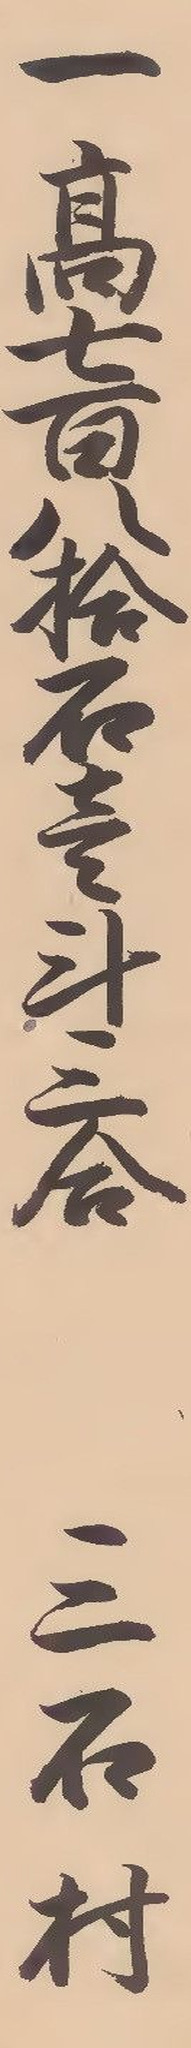一髙七百八拾石壱斗三合三石村

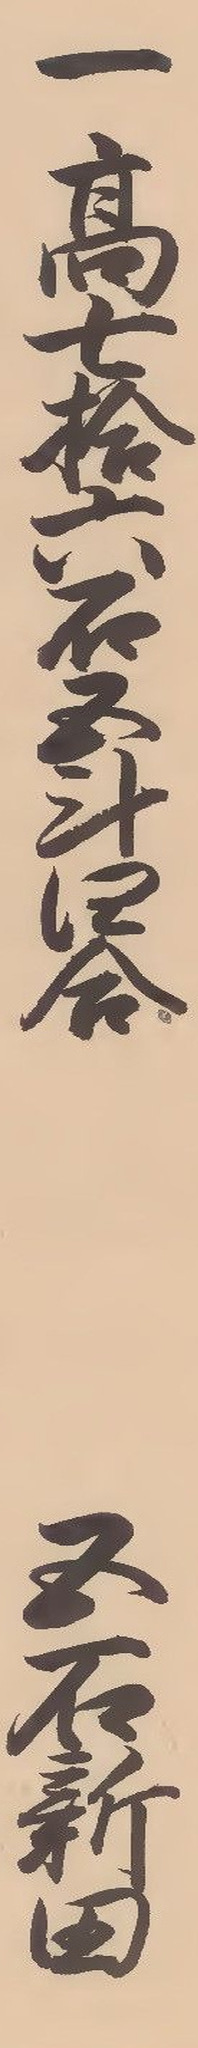一髙七拾六石五斗四合五石新田
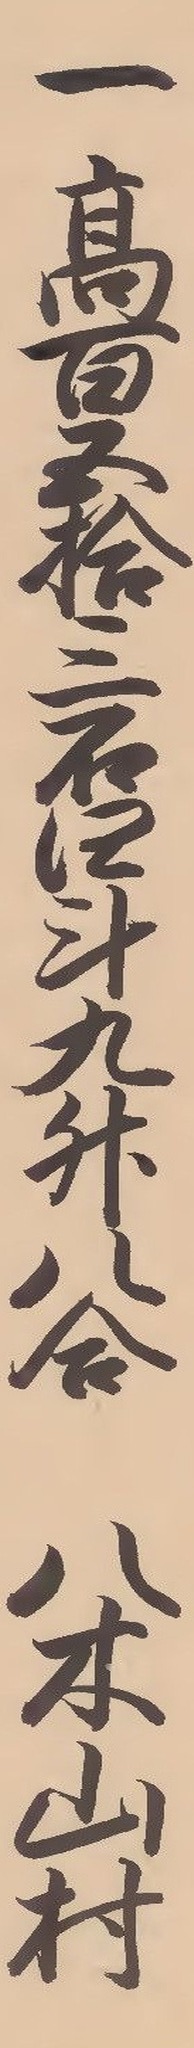一髙百五拾三石四斗九升八合八木山村
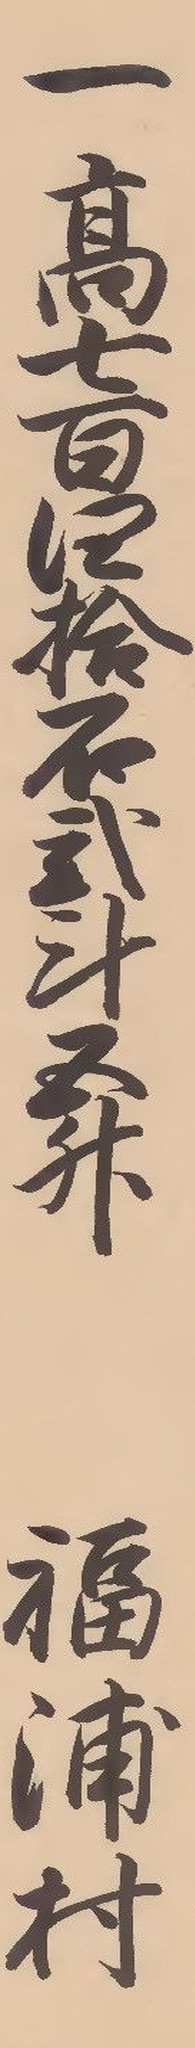一髙七百四拾石弐斗五升福浦村
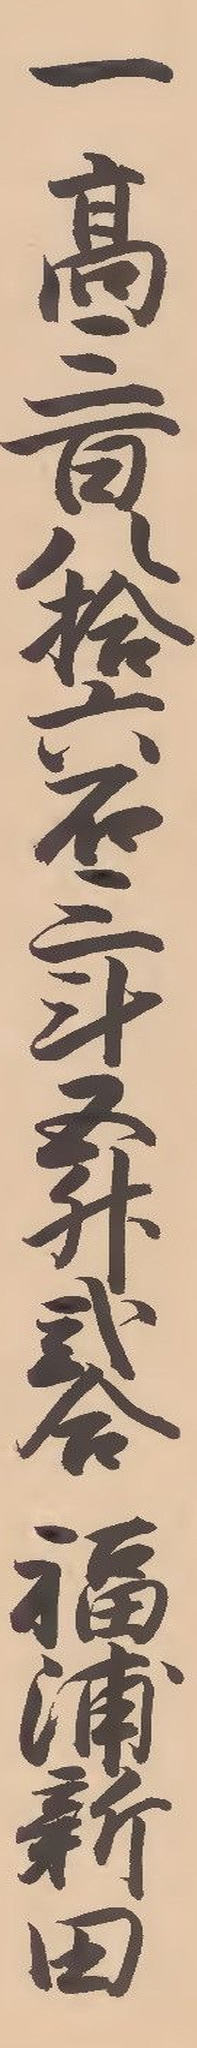一髙三百八拾六石三斗五升五合福浦新田
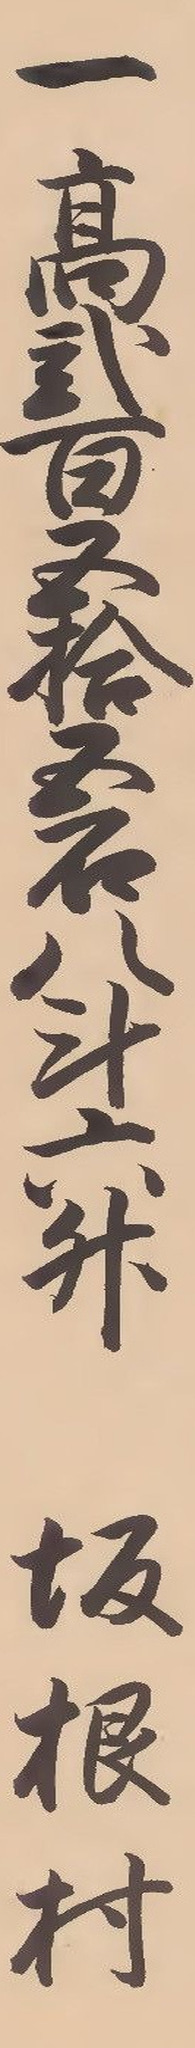一髙弐百五拾五石八斗六升坂根村
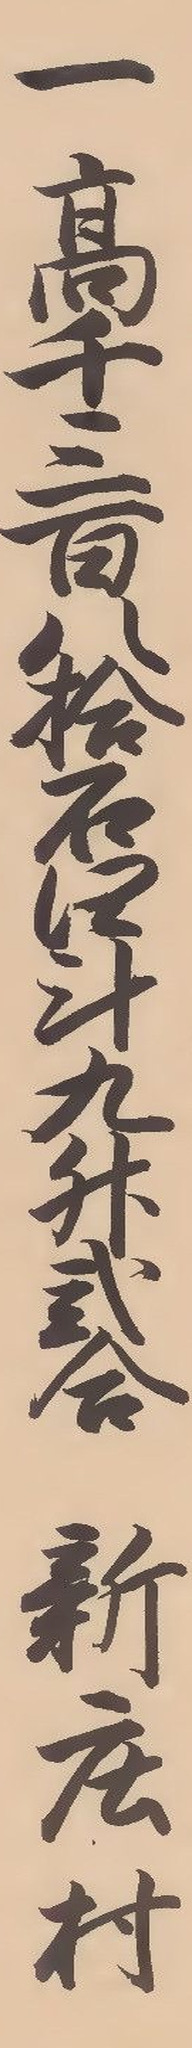一髙千三百八拾石四斗九升弐合新庄村
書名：備前国郷帳
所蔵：国立公文書館 National Archives of Japan
